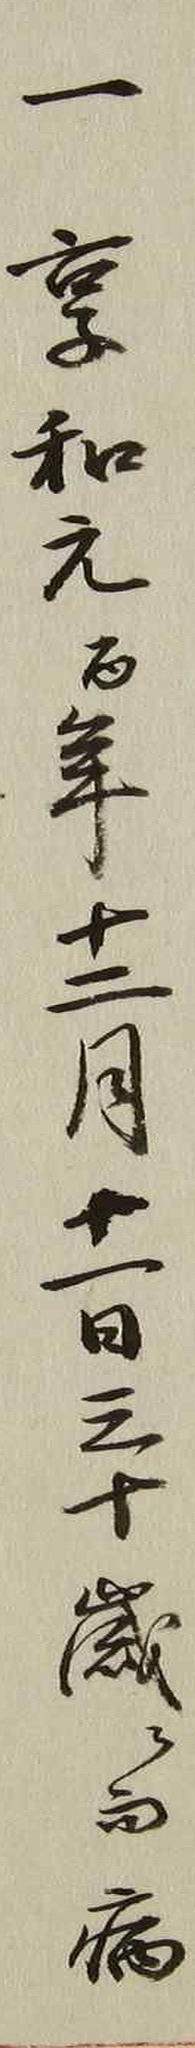一享和元酉年十二月十一日三十歳に而病
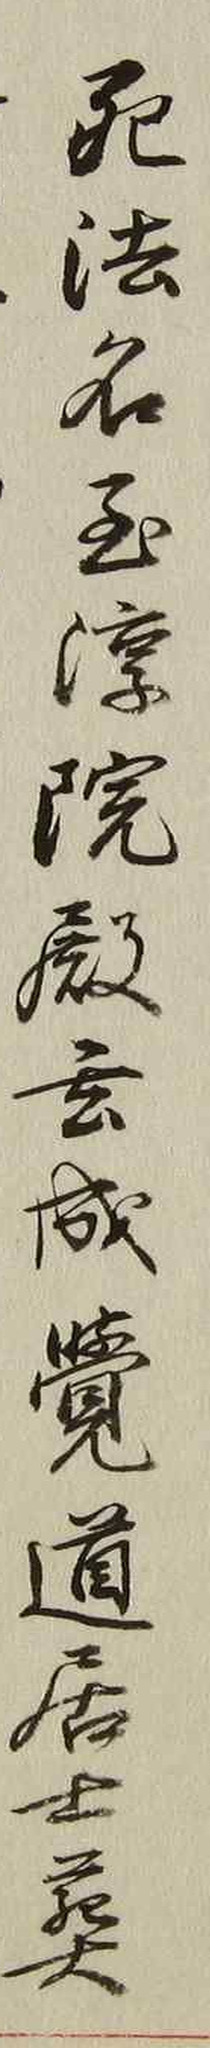死法名至淳院殿玄成覚道居士葬
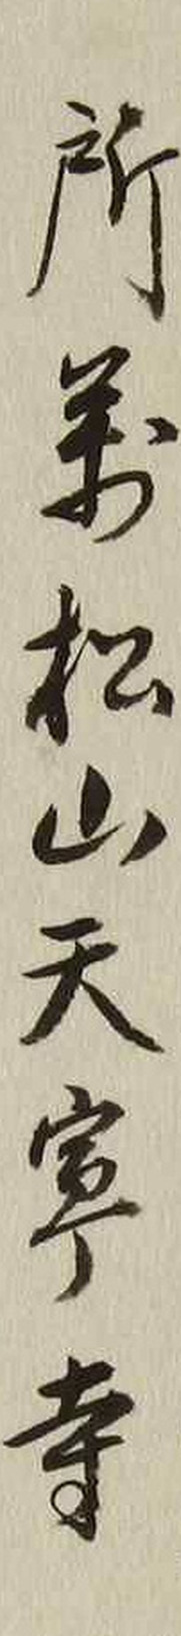所萬松山天寧寺
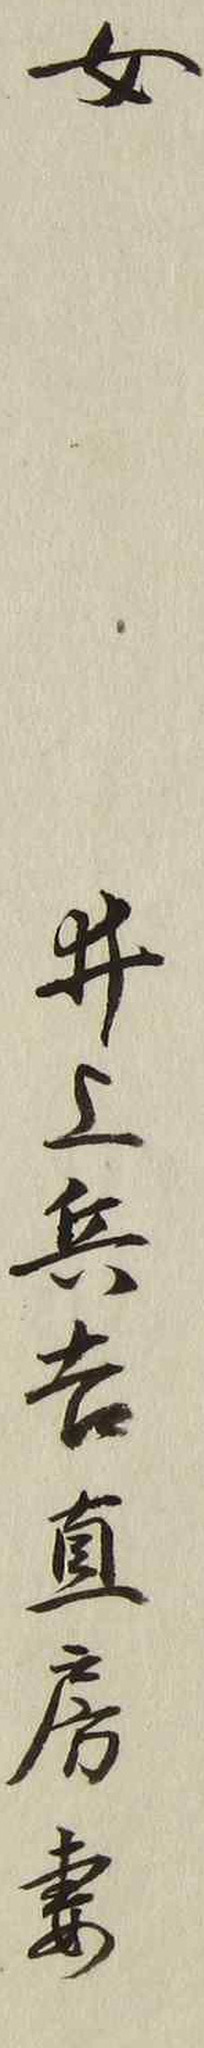女井上兵吉直房妻
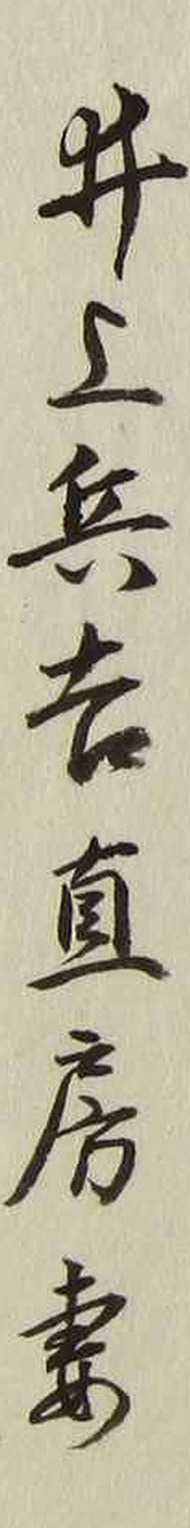女井上兵吉直房妻
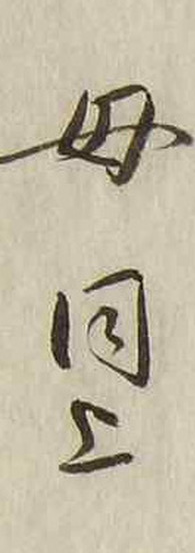母同上

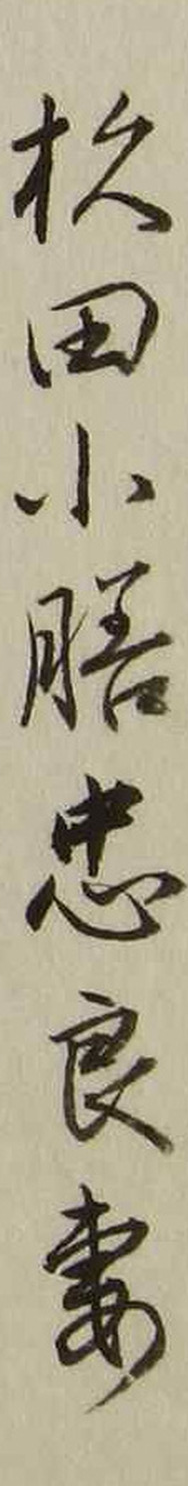女杉田小膳忠良妻
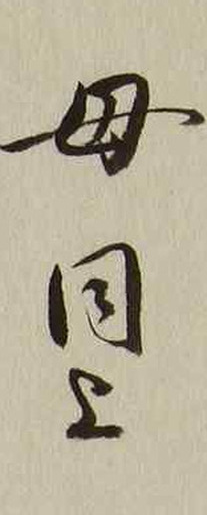母同上
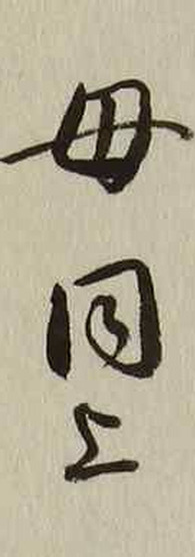母同上
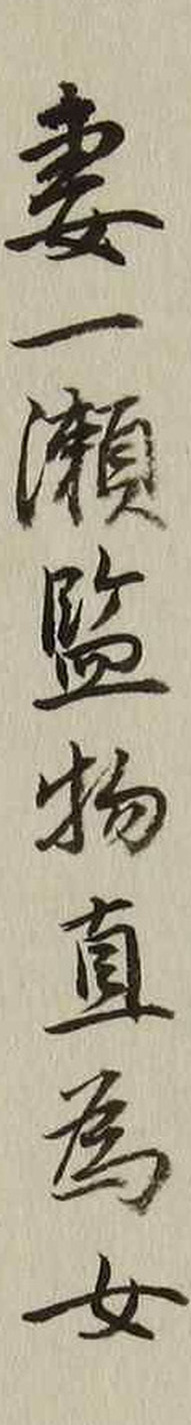妻一瀬監物直為女
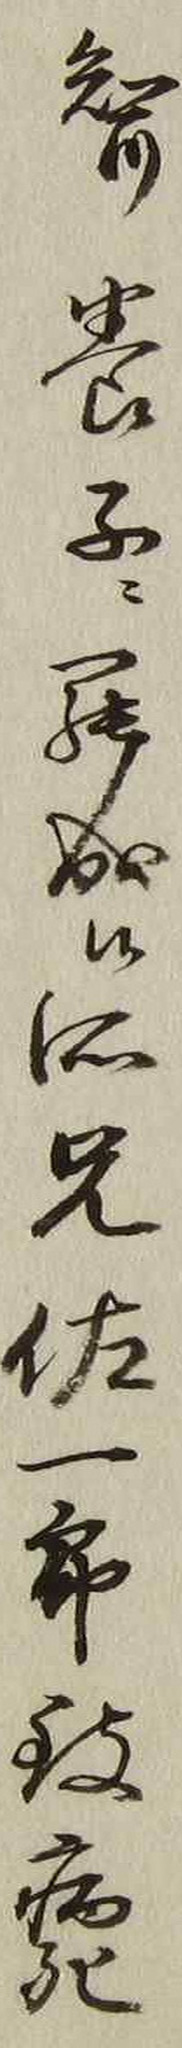聟養子に罷成候所兄佐一郎致病死
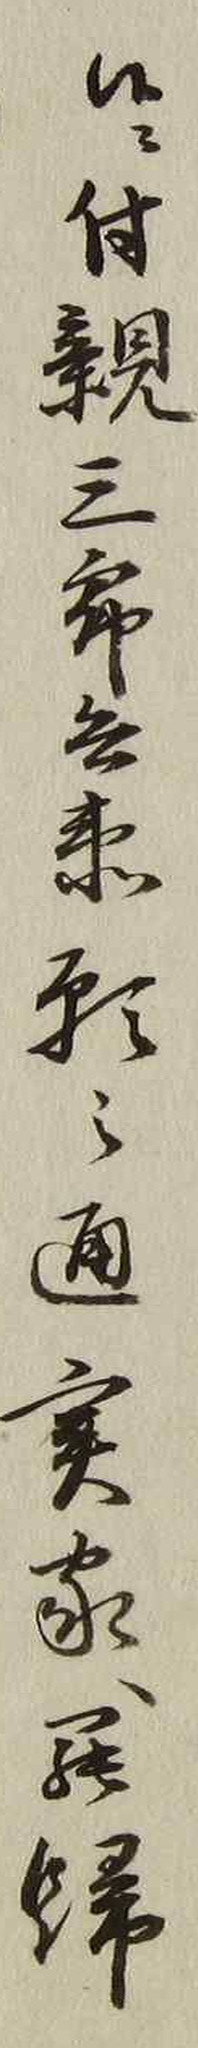候に付親三郎兵衛願之通実家へ罷帰
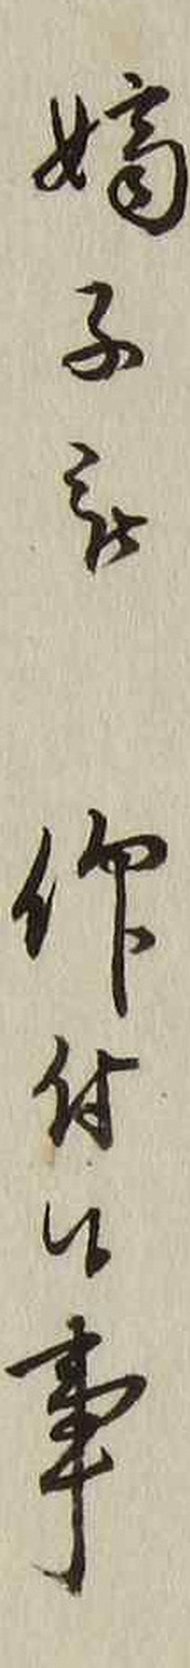嫡子被仰付候事
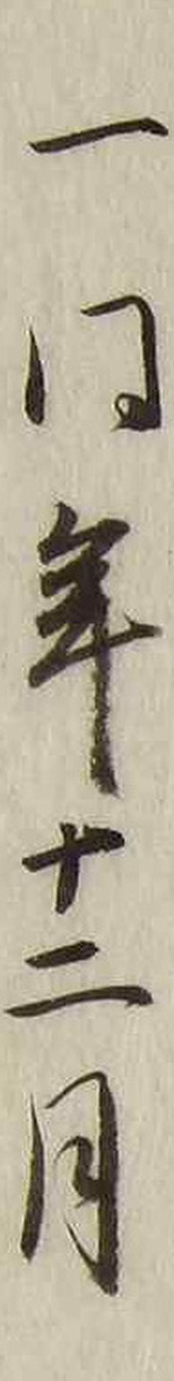一同年十二月
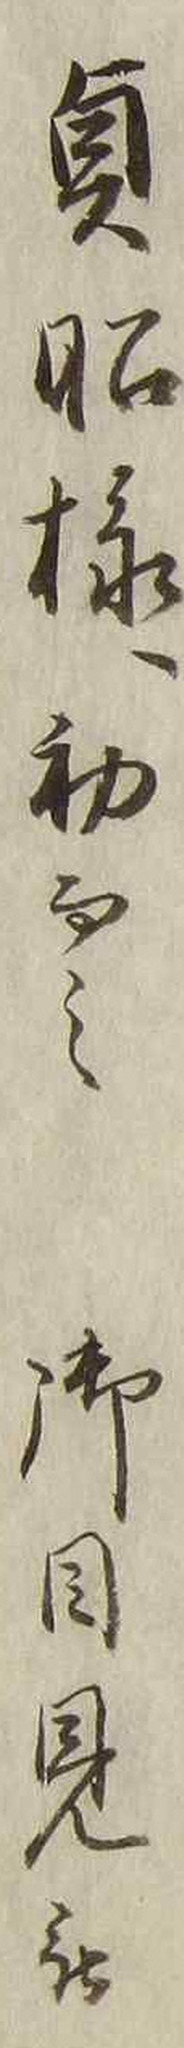貞昭様へ初而之御目見被

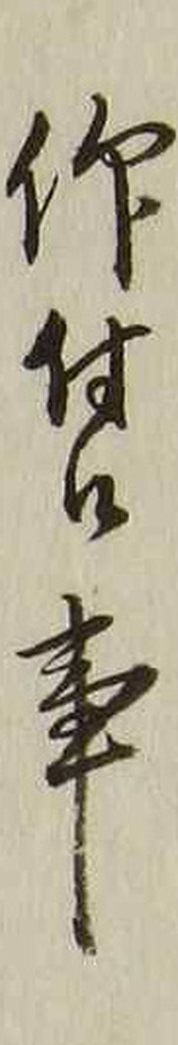仰付候事
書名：諸士系譜　巻之125　た之部1
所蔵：会津若松市立会津図書館
